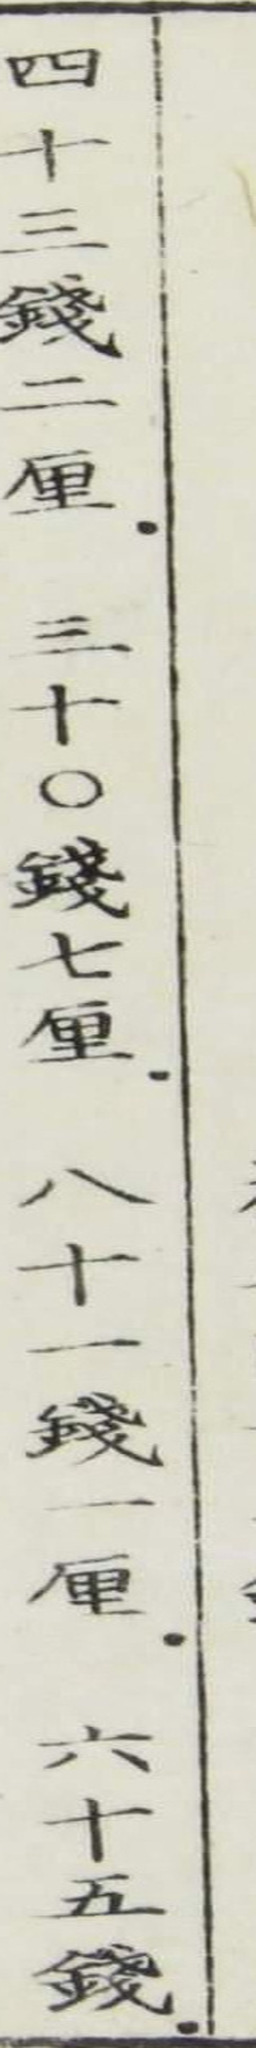四十三銭二厘、三十〇銭七厘、八十一銭一厘、六十五銭、
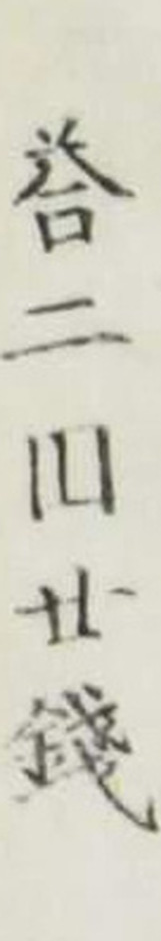答二円廿銭
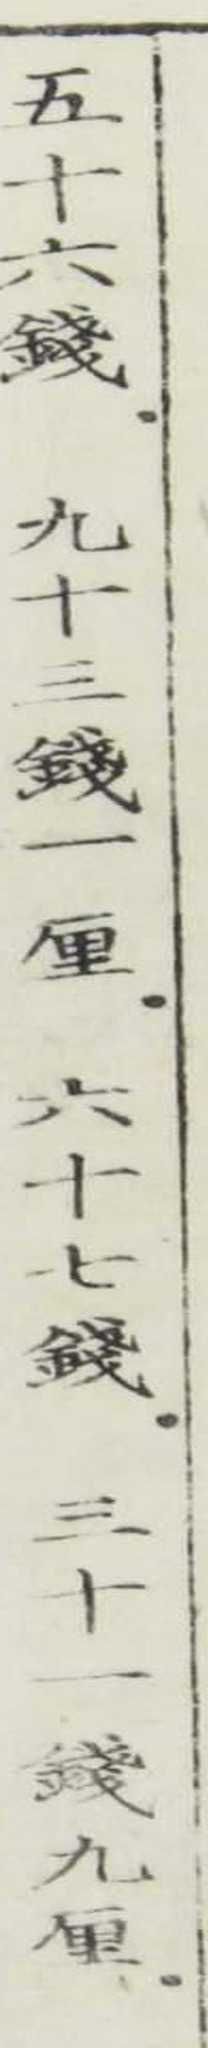五十六銭、九十三銭一厘、六十七銭、三十一銭九厘、
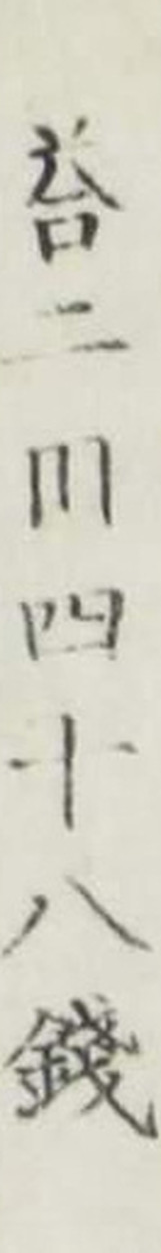答二円四十八銭
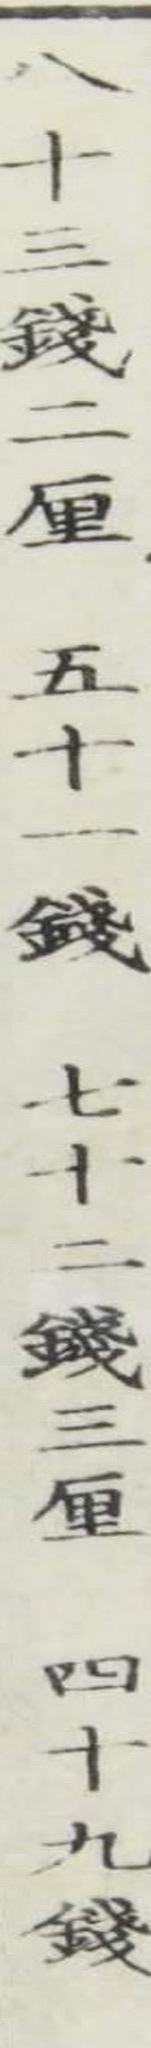八十三銭二厘、五十一銭、七十二銭三厘、四十九銭、
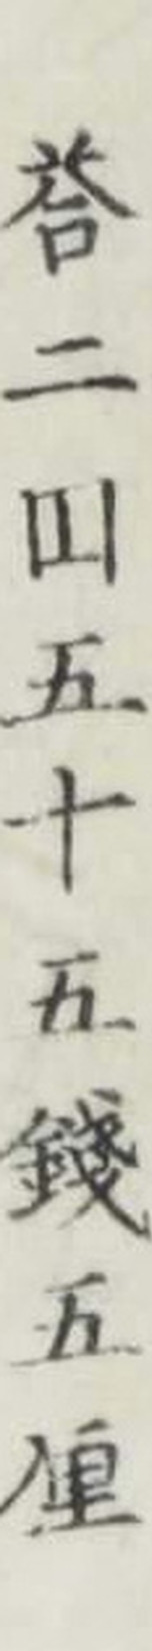答二円五十五銭五厘
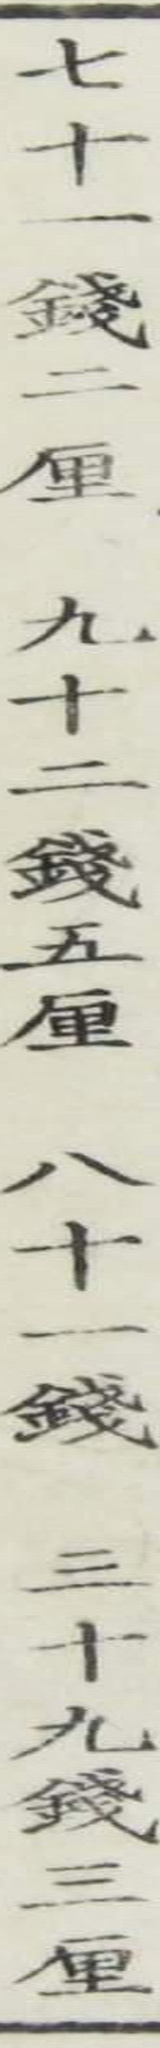七十一銭二厘、九十二銭五厘、八十一銭、三十九銭三厘、
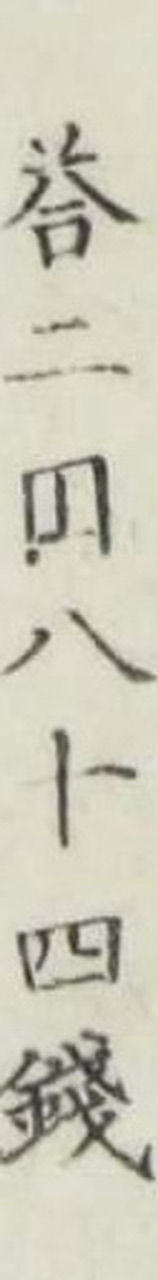答二円八十四銭
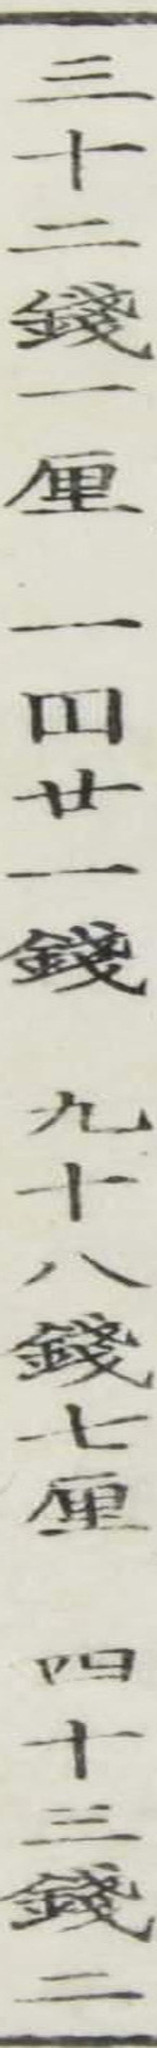三十二銭一厘、一円廿一銭、九十八銭七厘、四十三銭二
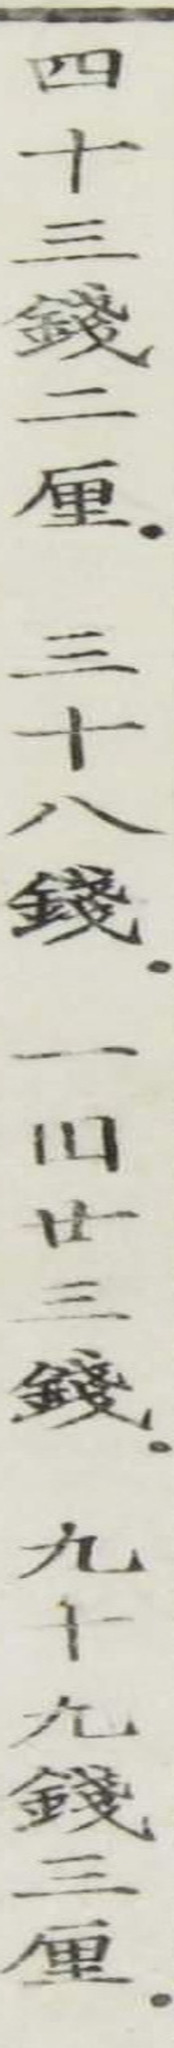四十三銭二厘、三十八銭、一円廿三銭、九十九銭三厘、
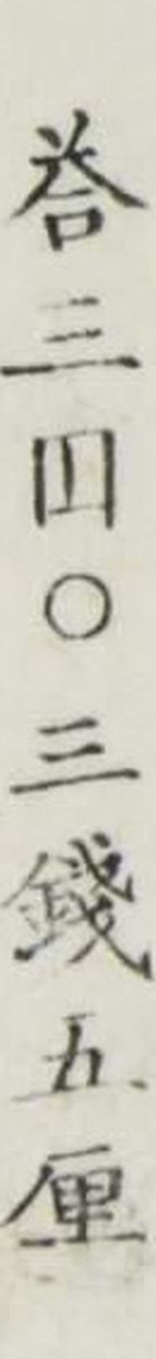答三円〇三銭五厘
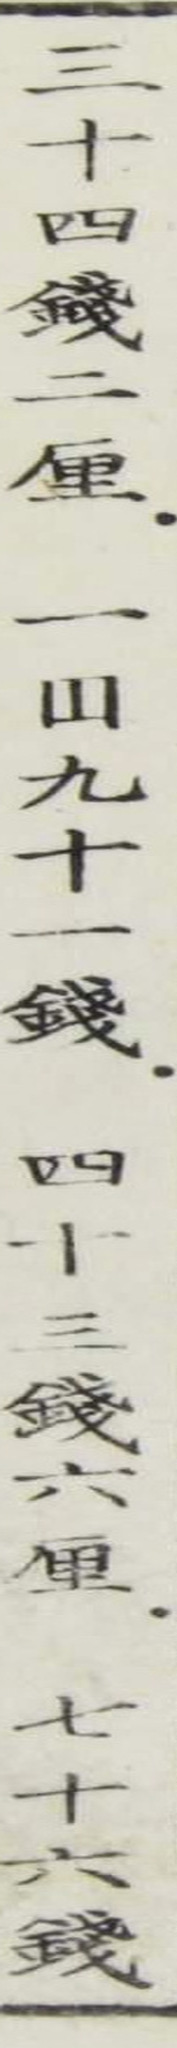三十四銭二厘、一円九十一銭、四十三銭六厘、七十六銭
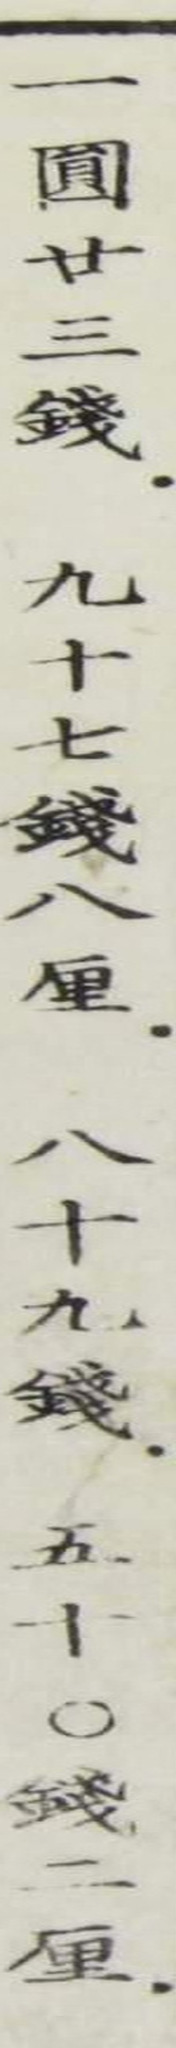一円廿三銭、九十七銭八厘、八十九銭、五十〇銭二厘
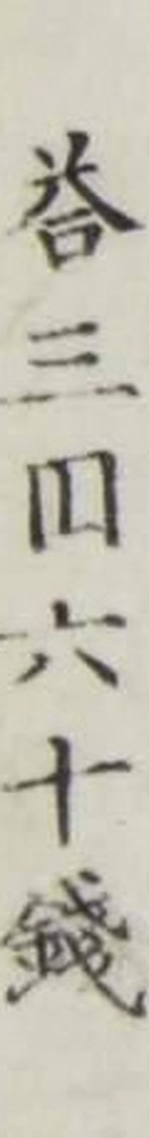答三円六十銭

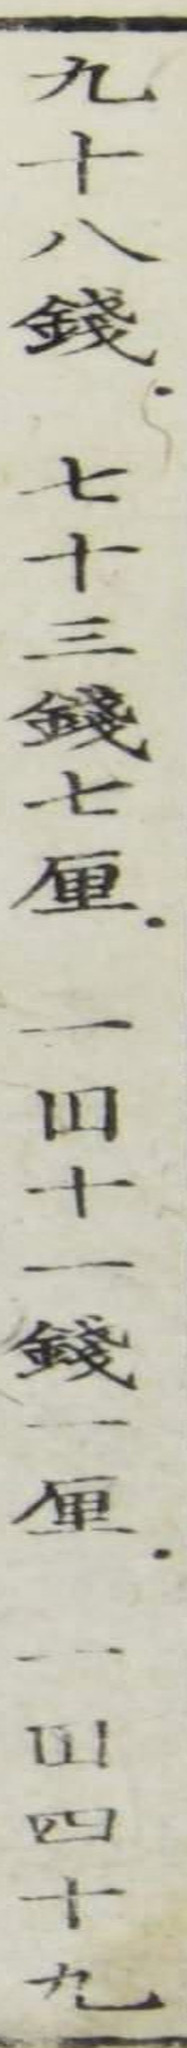九十八銭、七十三銭七厘、一円十一銭一厘、一円四十九
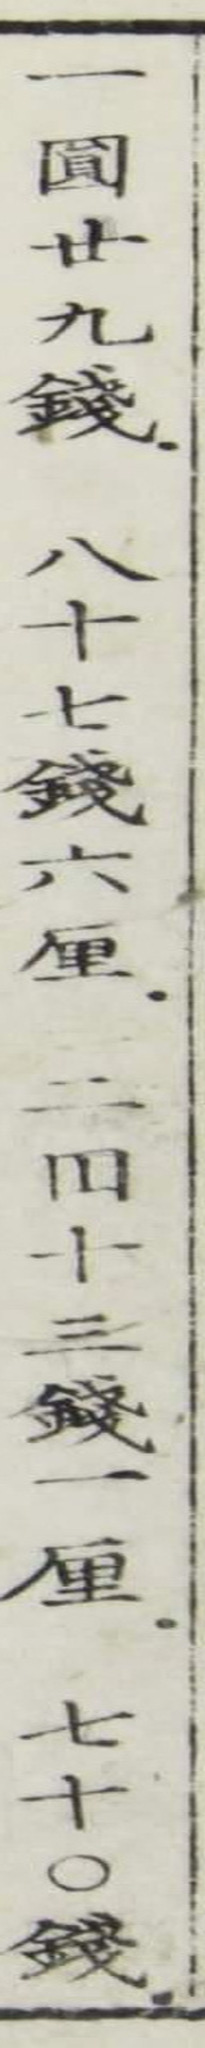一円廿九銭、八十七銭六厘、二円十三銭一厘、七十〇銭
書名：明治小學塵劫記 卷1
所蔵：東京学芸大学教育コンテンツアーカイブ
